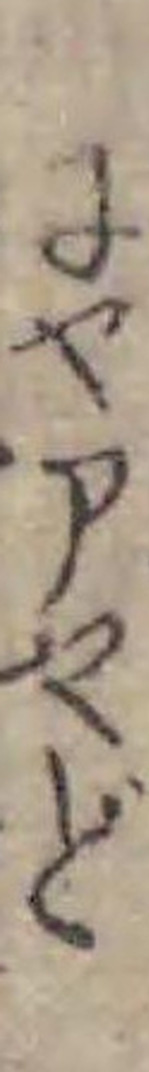にヤアやど
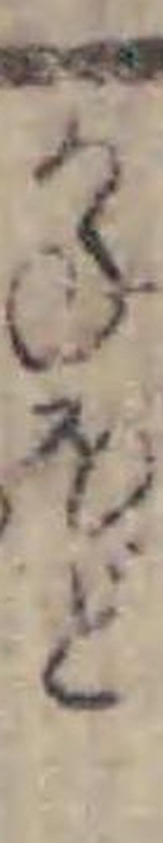かねほど
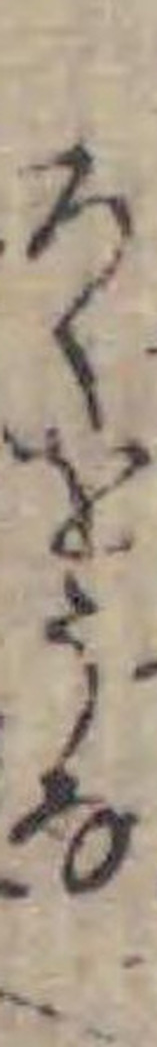ろくをうな
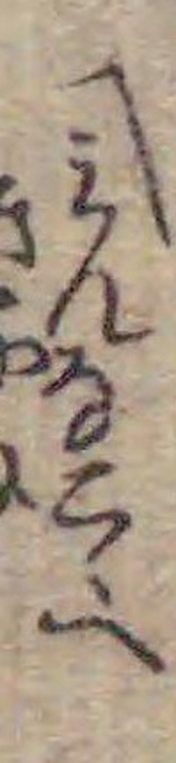〽みんなこゝへ
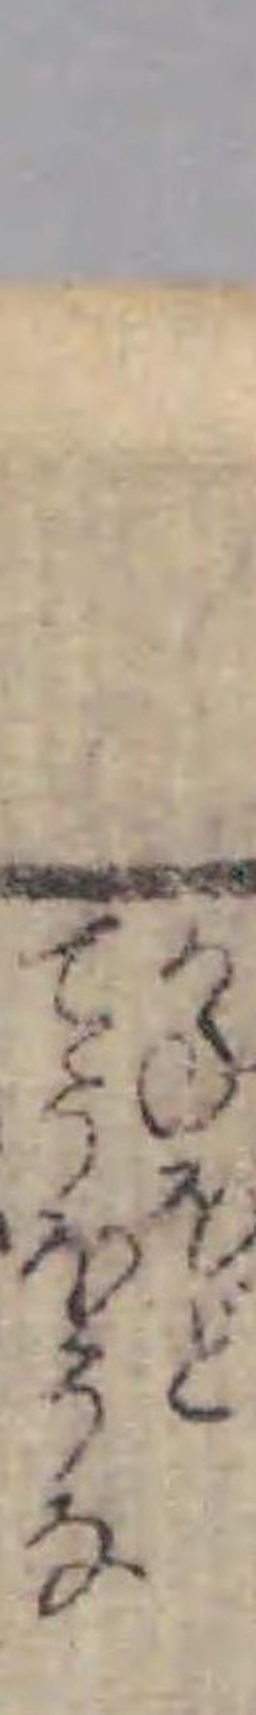てうほうな
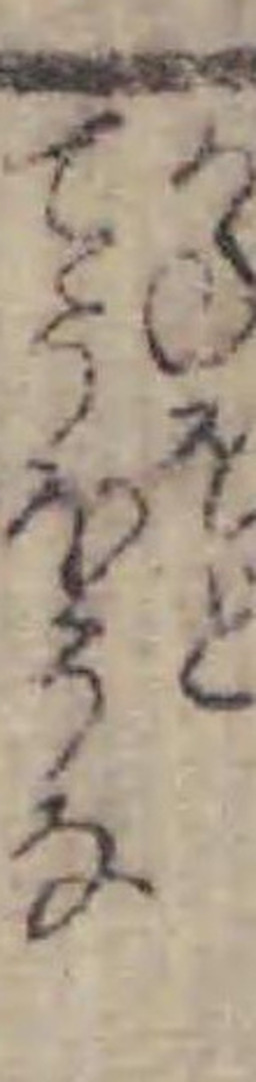てうほうな
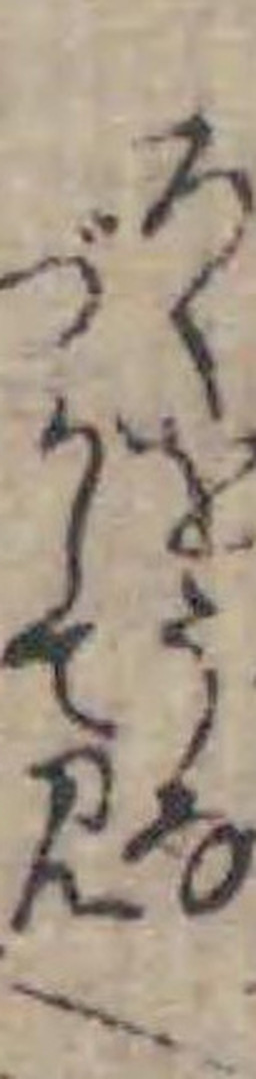づかして見
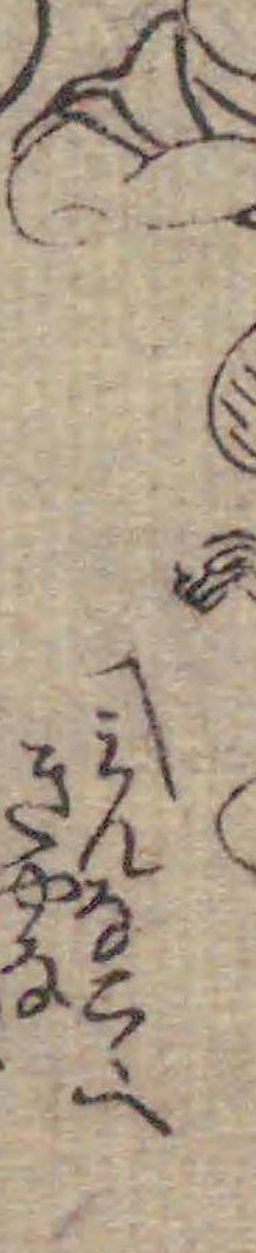〽みんなこゝへ
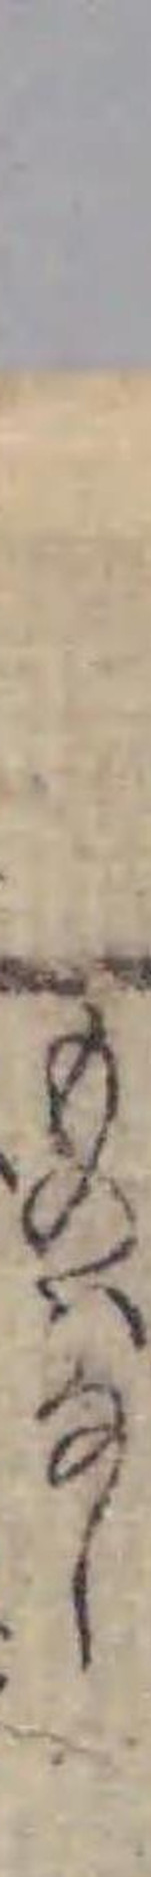ものはなし
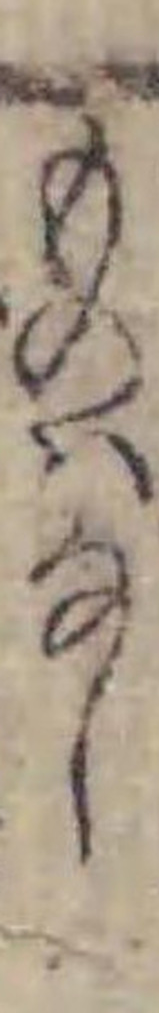ものはなし
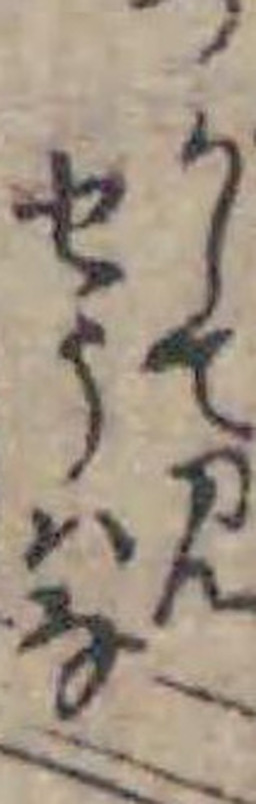せうはな
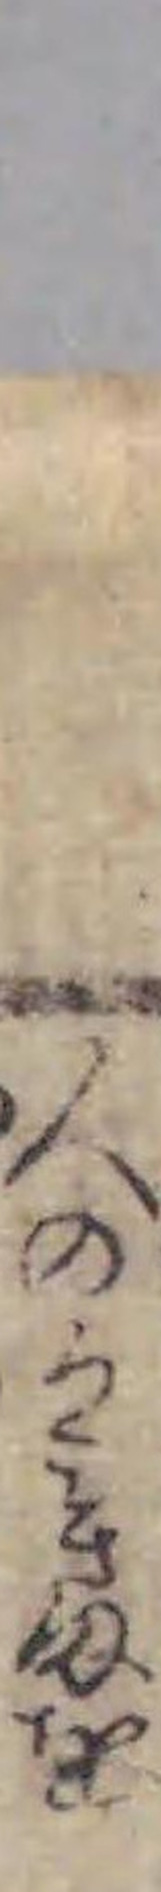人のかみさまを
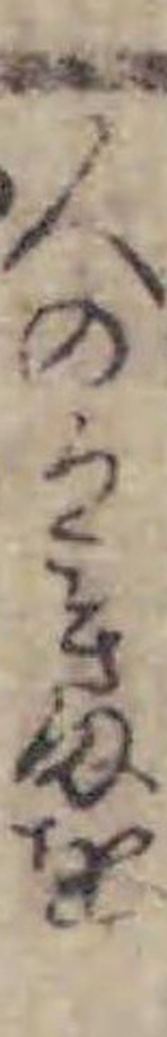人のかみさまを
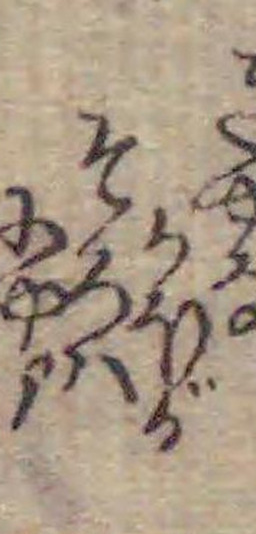にやァ
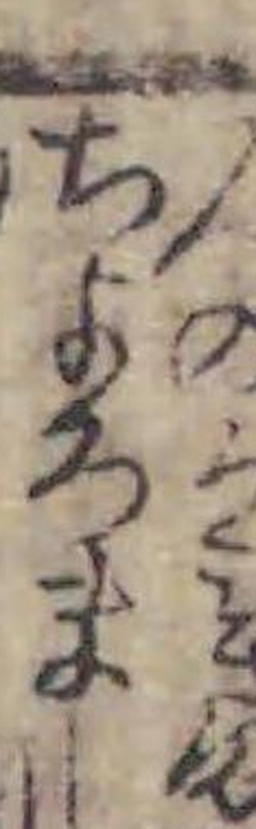ちよろま
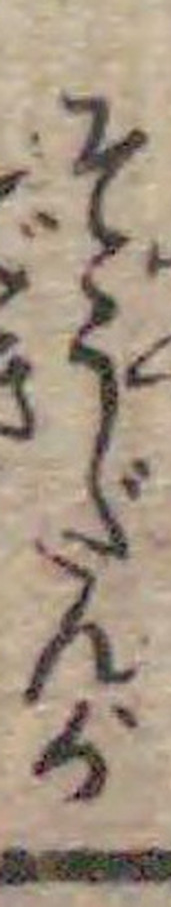そうだんが
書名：新鋳小判 : 3巻
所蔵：国立国会図書館 National Diet Library, JAPAN
